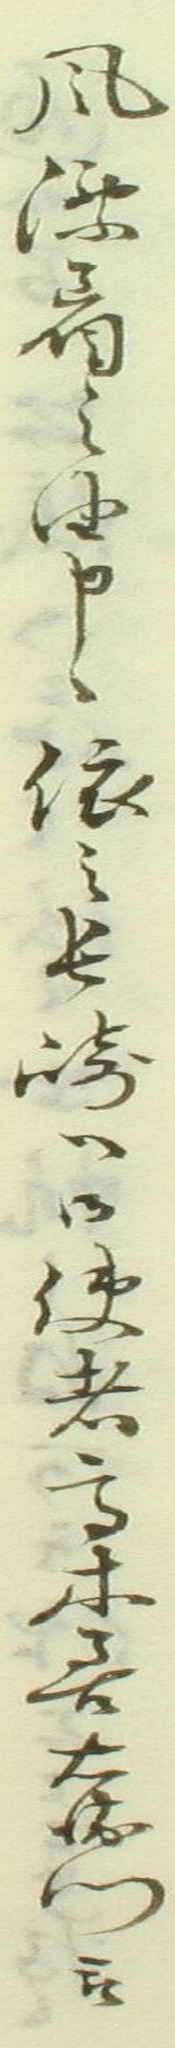風漂着之由申候依之長崎へ御使者高木善右衛門被
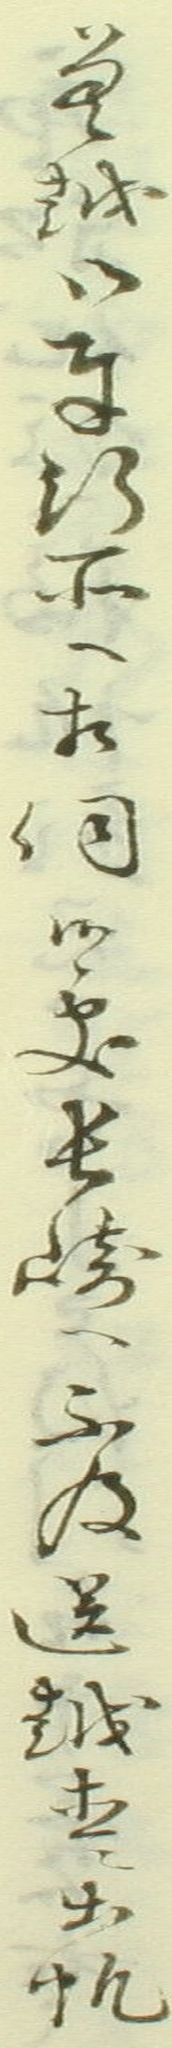差越御奉行所へ相伺候処長崎へ不及差越直に出帆
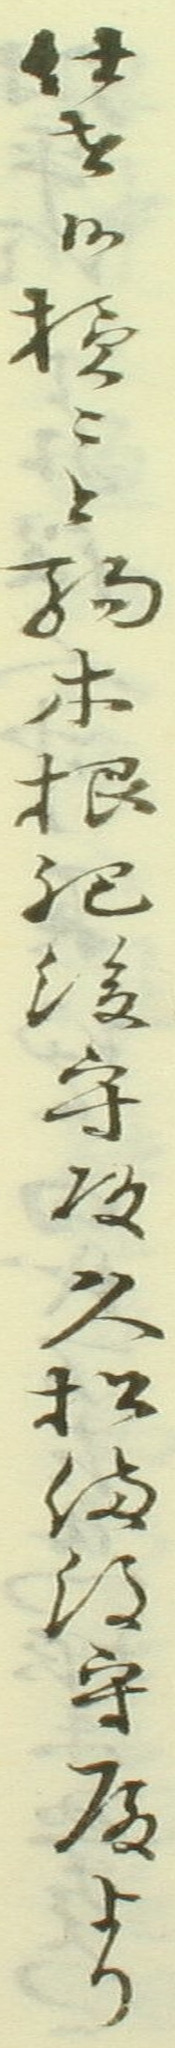仕世候様にと駒木根肥後守殿久松備後守殿より
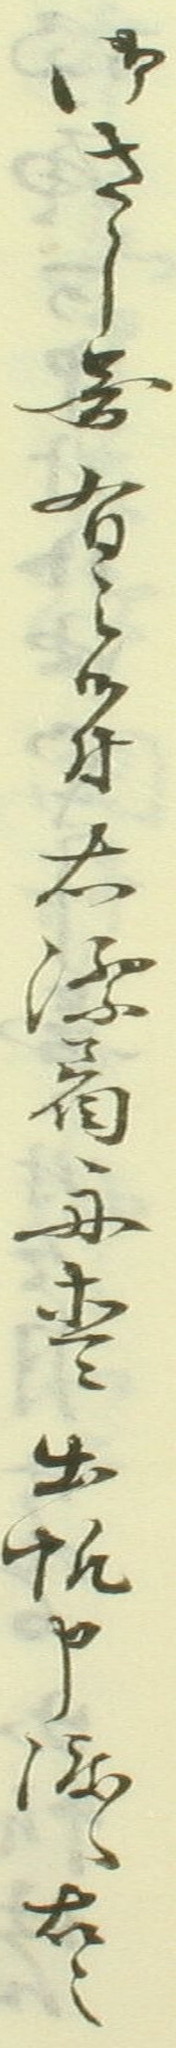御さし図有之候付右漂着舟直に出帆申渡候右之
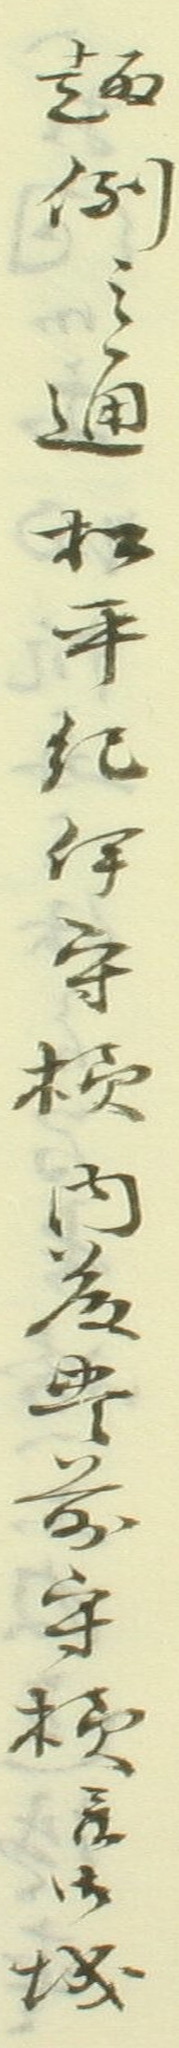趣例之通松平紀伊守様内藤豊前守様共御城
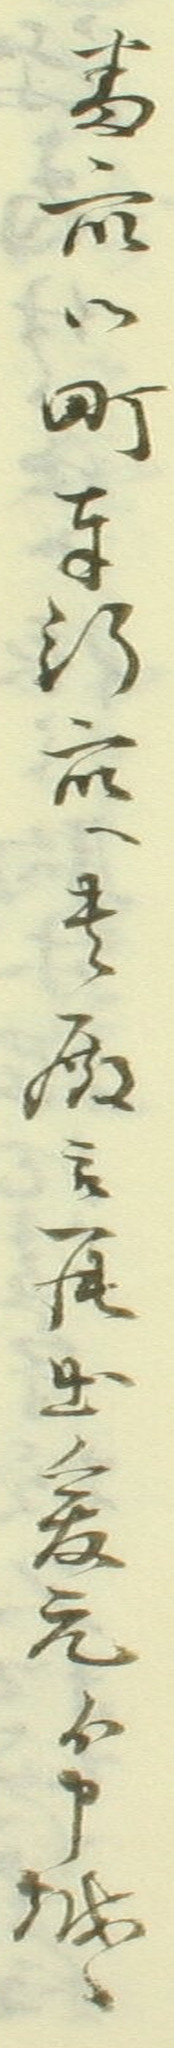番衆御町奉行衆へ貴殿被罷出爰元ゟ申越候
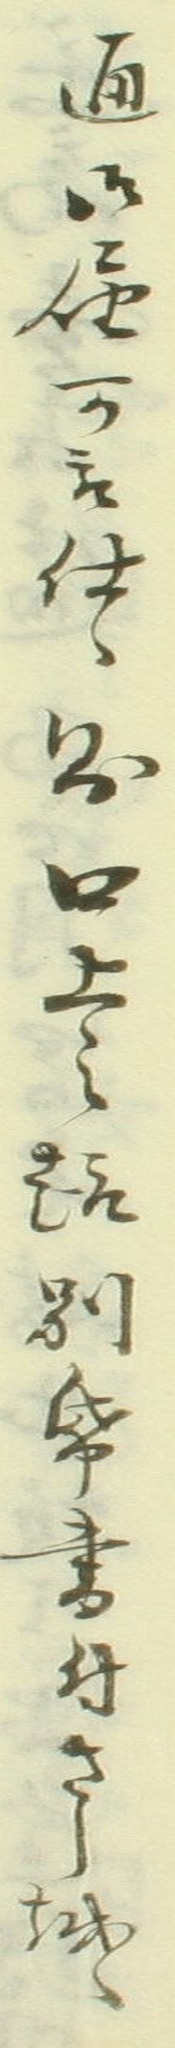通御届可被仕候則口上之趣別紙書付さし越候
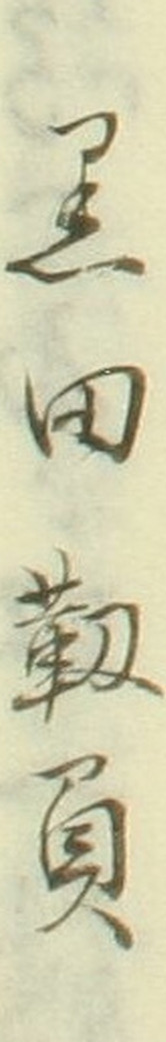黒田靭負
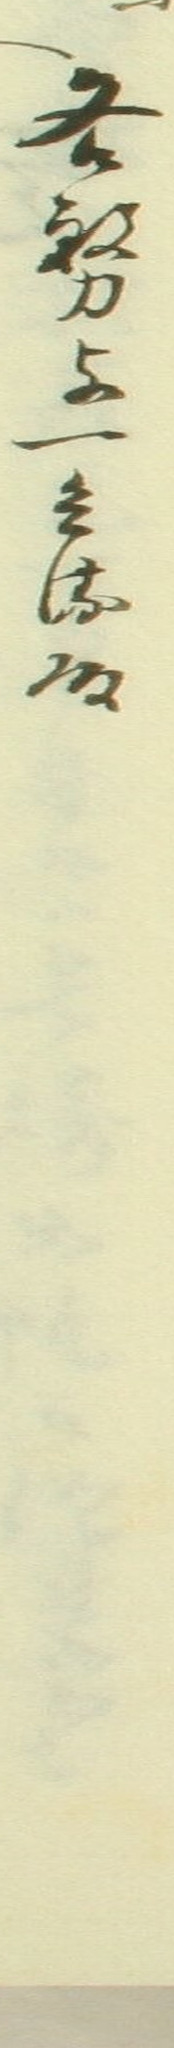各務与一兵衛殿
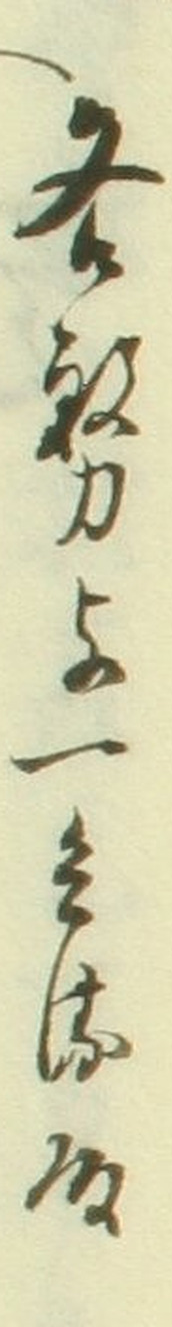各務与一兵衛殿
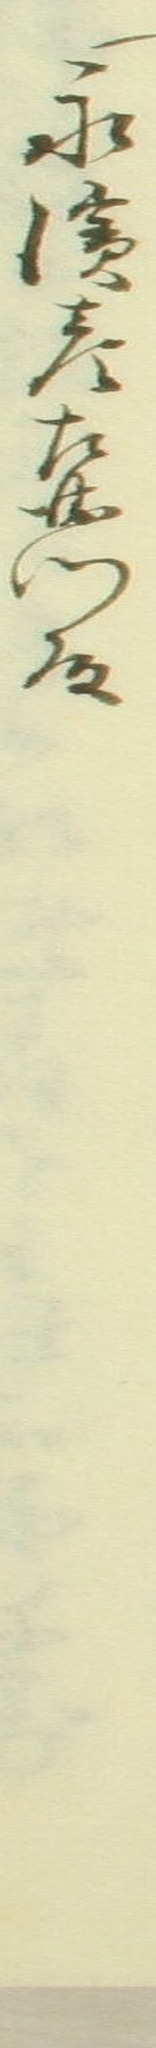永浜彦左衛門殿
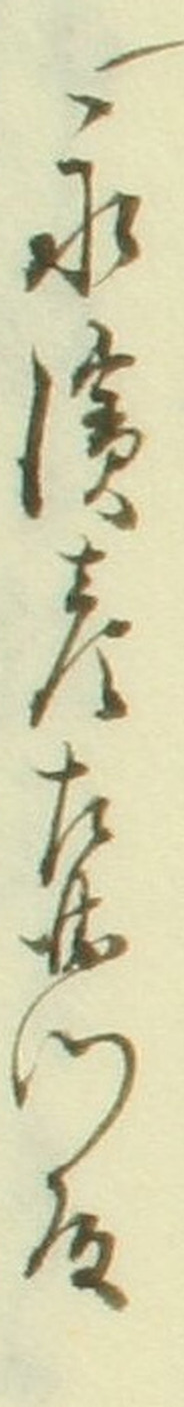永浜彦左衛門殿
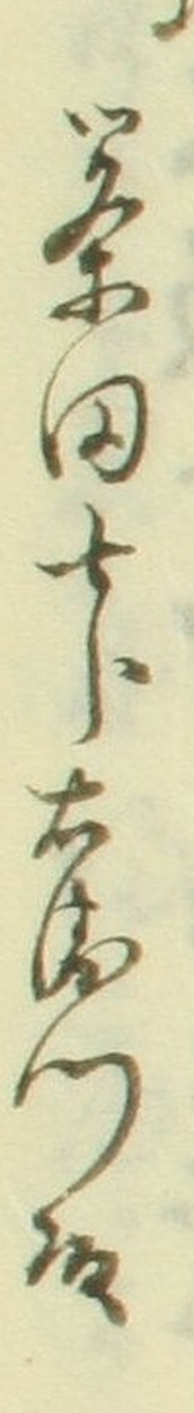茶田十郎右衛門殿

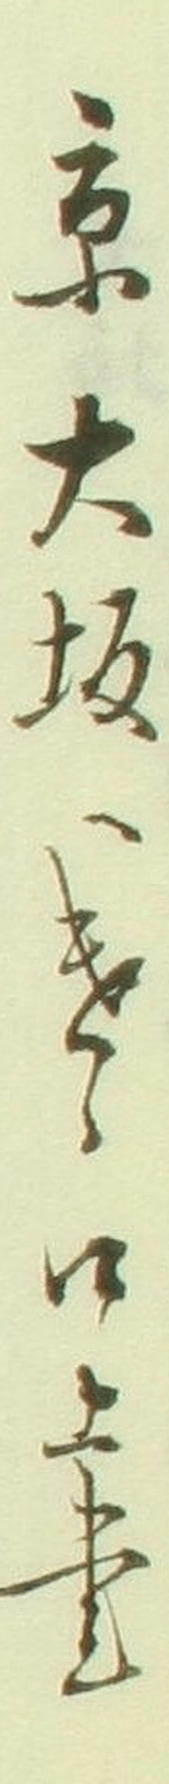京大坂へ遣候口上書
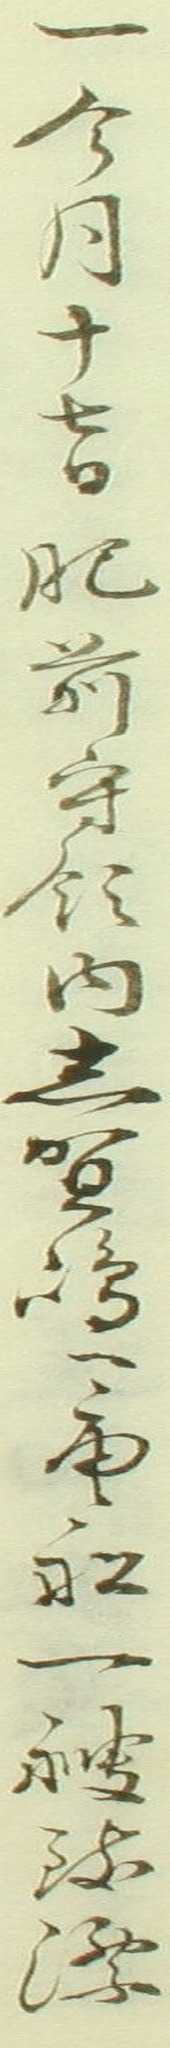一今月十七日肥前守領内志賀島へ唐船一艘致漂
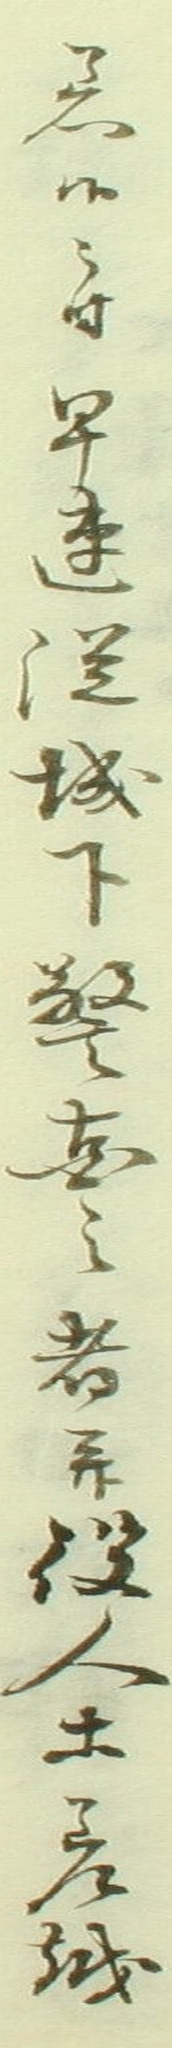着候に付早速従城下警固之者并役人等差越
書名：異国船漂着記
